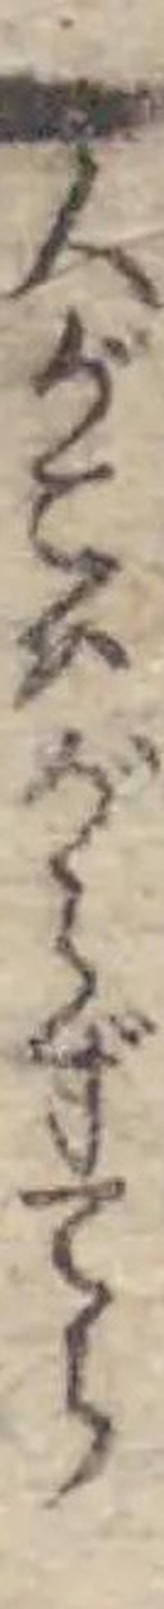人がこはがらずてら
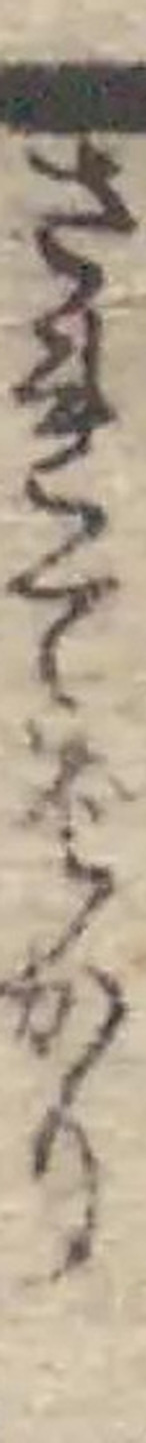されてばかり
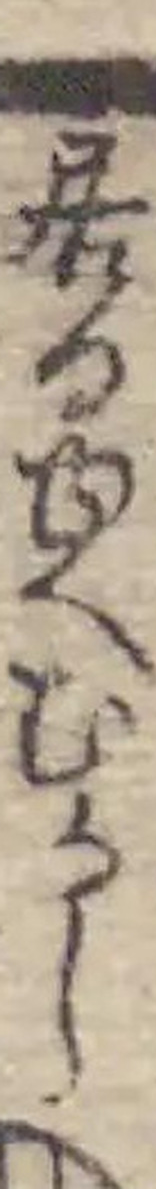居るゆへむかし
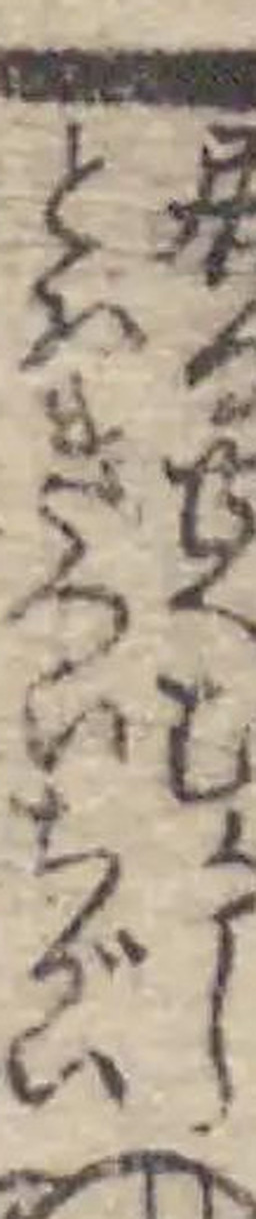とはきついちがい
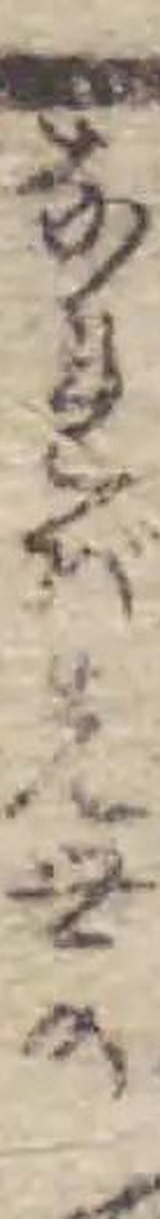なれば先世の
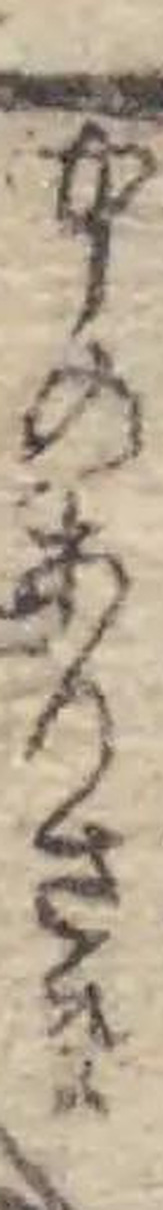中のありさま
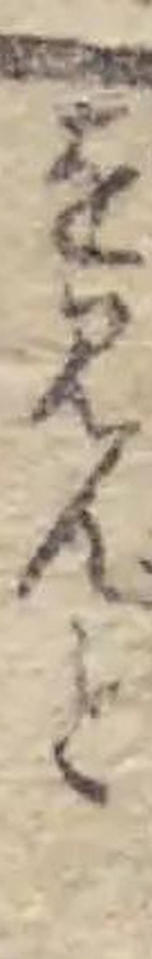を見んと
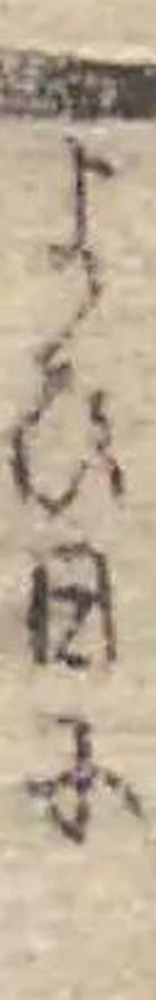よひ日に
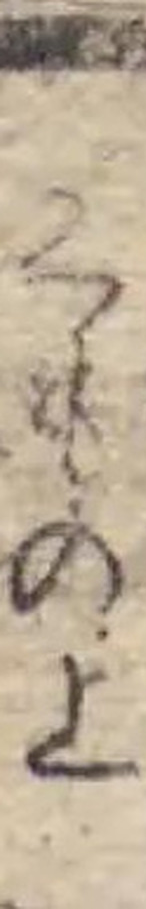くもの上
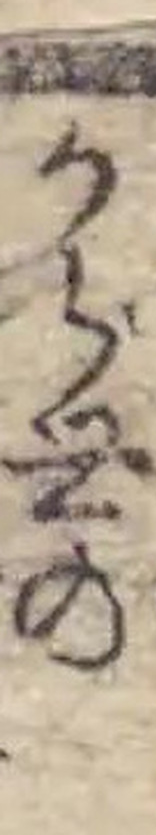から世の
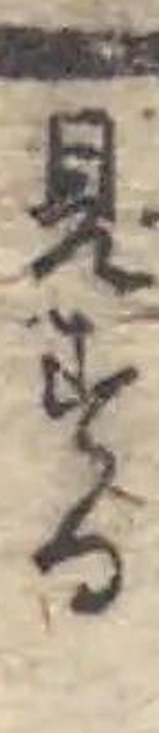見する
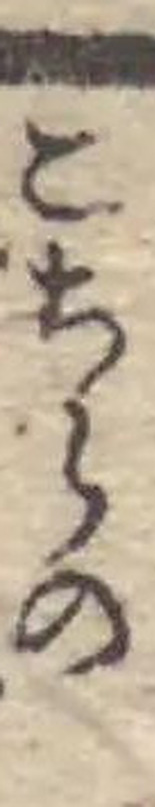こちらの
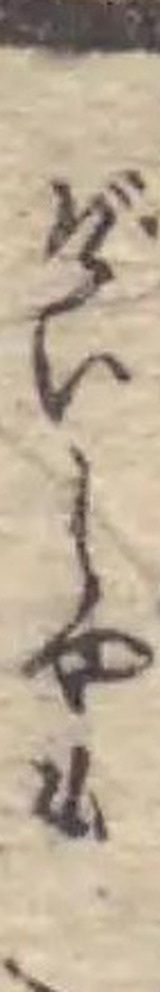げいしやも
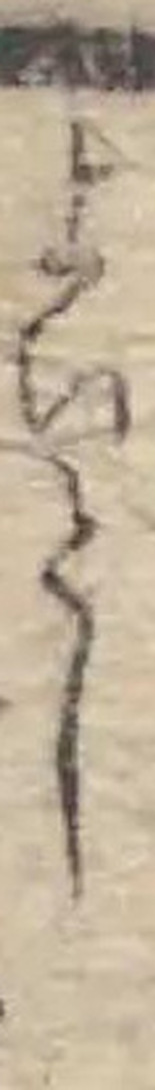よいとし
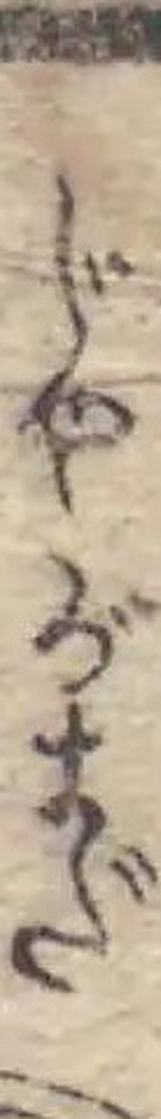じやがまだ
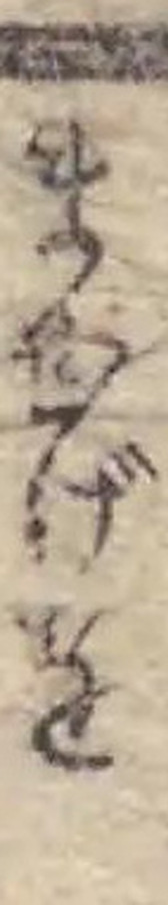まゆげを
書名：作意妖恐懼感心 2巻
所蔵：国立国会図書館 National Diet Library, JAPAN
